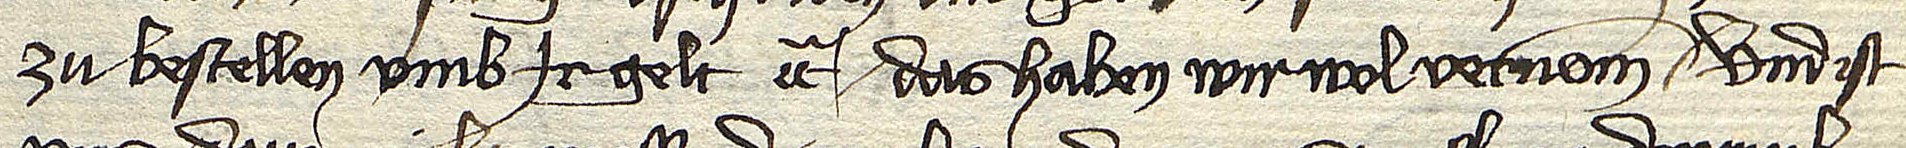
ʒu beſtellen vmb Ir gelt ec* / das haben wir wol vernom* / Vnd iſt
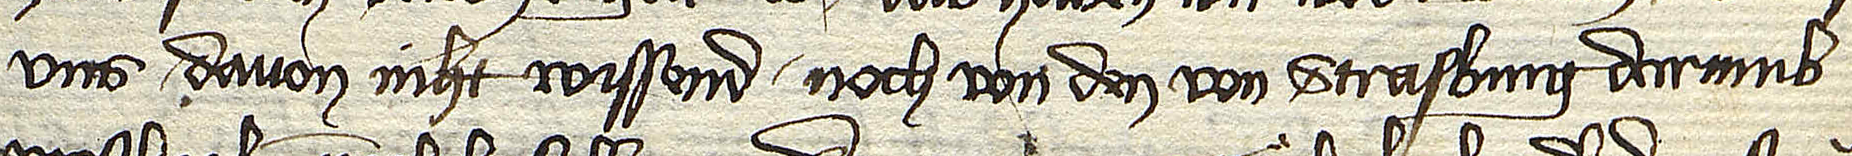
vns / dauon niht wiſſend / noch von den von Straſburg darumb
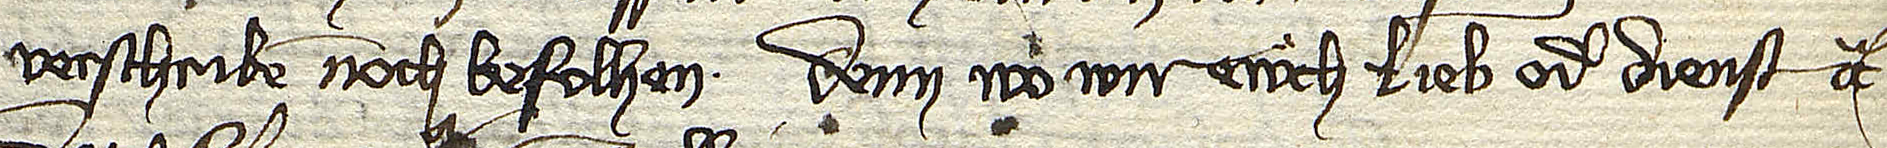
verſchribe* noch befolhen . Denn do wir ewch lieb od* dienſt ec*
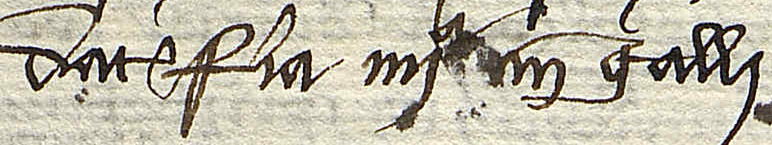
Dat* fia* iiii* an* galli
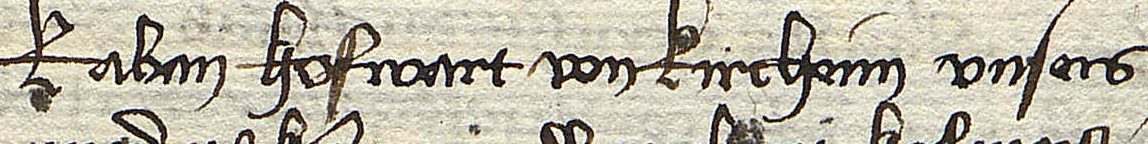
Raban hofwart von Kircheim vnſers
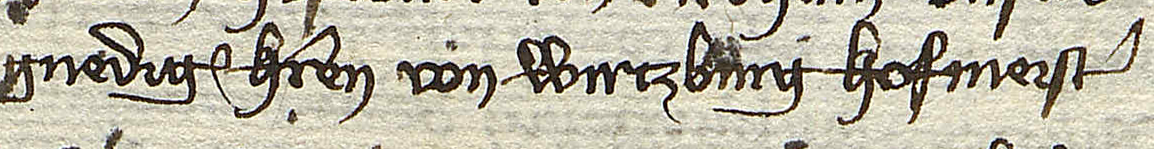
gnedig* h*ren von wircʒburg hofmeiſt*
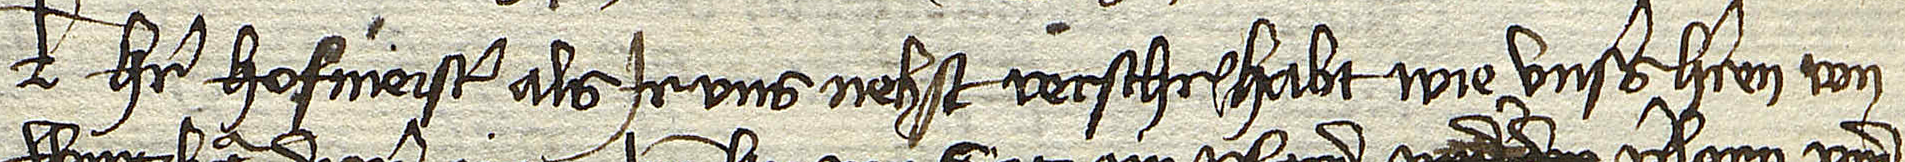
L* h*r hofmeiſt* als Ir vns nehſt verſchr* habt wie vnſ*s h*ren von
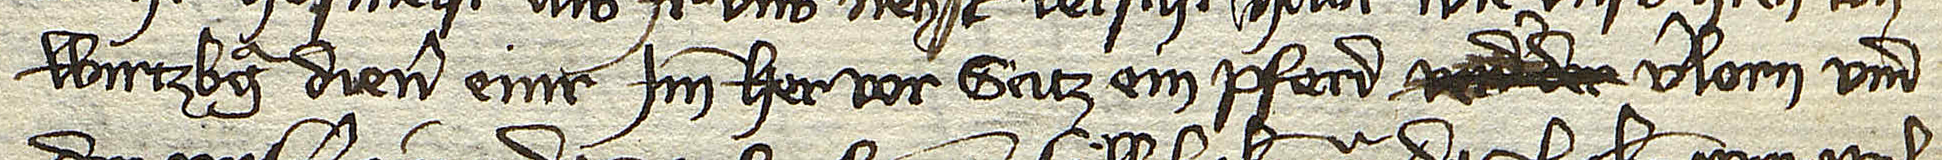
wircʒb*g dien* einr Im* her vor Sacʒ ein pferd wid* der v*lorn vnd
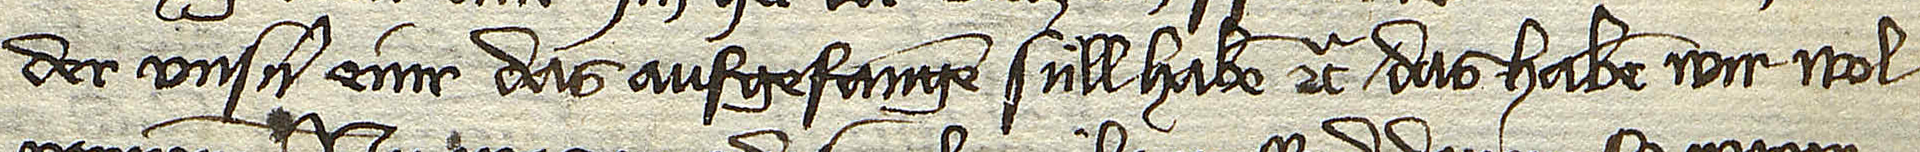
der vnſ*n einr das aufgefange* ſüll habe* / das habe* wir wol
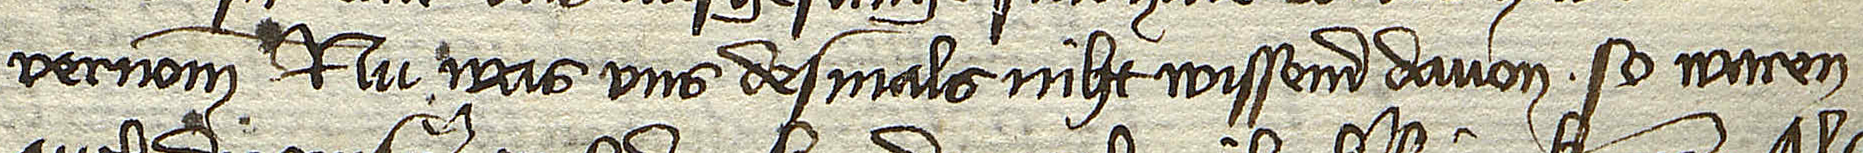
vernom* Nu was vns deſmals niht wiſſend dauon . ſo waren
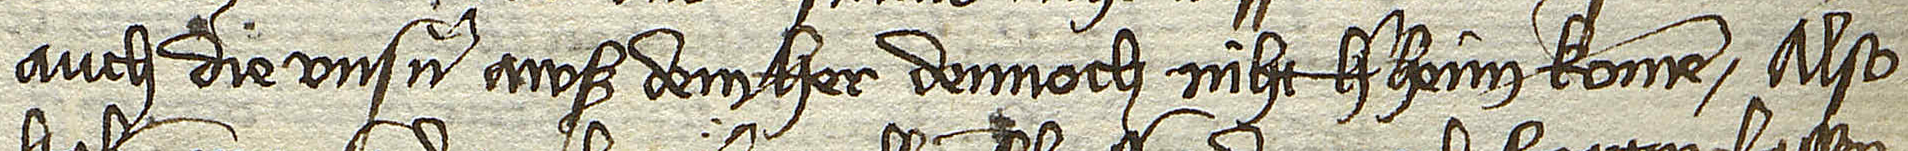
auch die vnſ*n awſʒ dem her dennoch niht h*heim kome* / Alſo
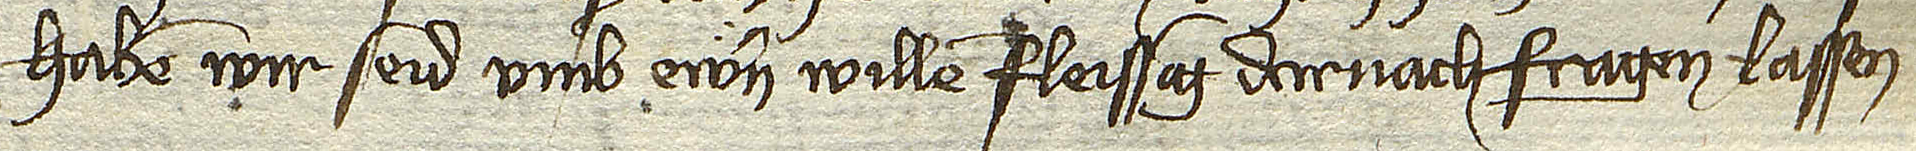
habe* wir ſeid vmb ew*n wille* fleiſſig darnach fragen laſſen
